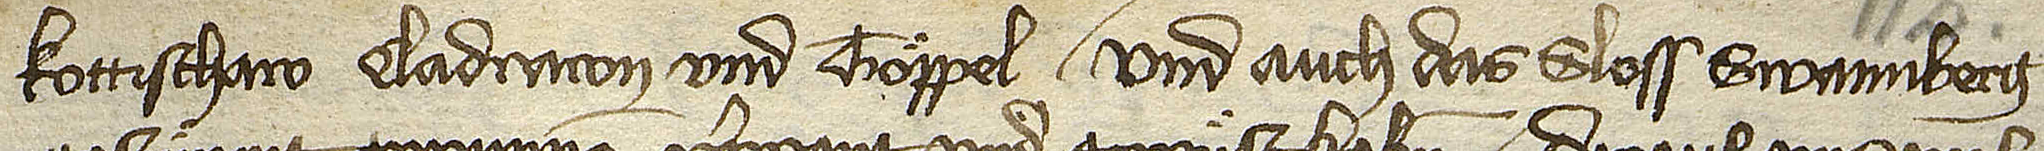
kottiſchaw Cladrawn vnd Töppel / vnd auch das Sloſſ Swannberg
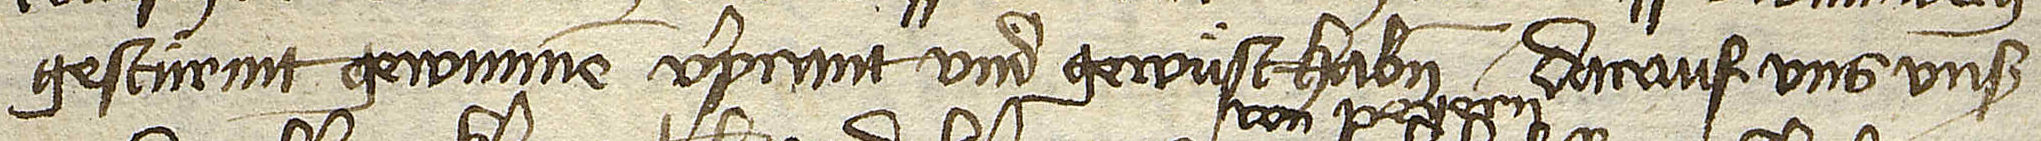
geſtürmt gewunne* v*prant vnd gewüſt habn* / Darauf vns vnſ*
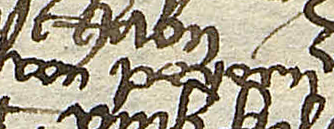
von peyern
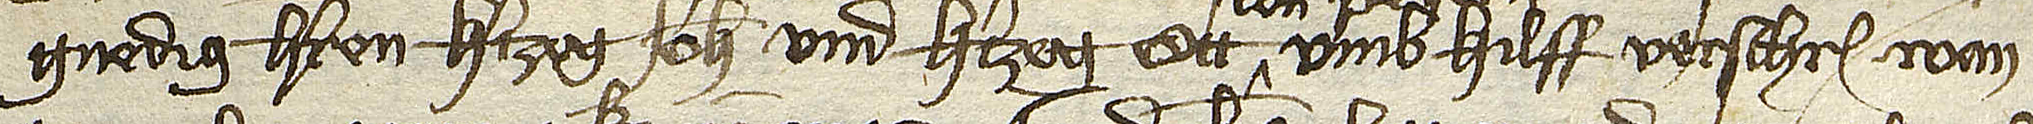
gnedig h*ren h*cʒog Ioh* vnd h*cʒog Ott vmb hilff verſchr* wan
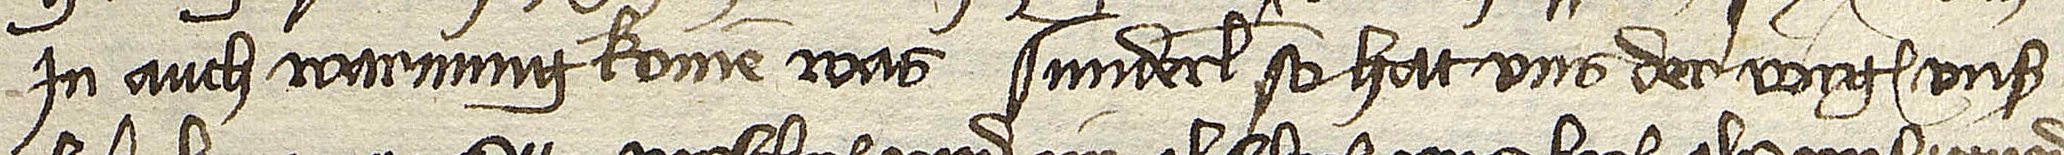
In auch warnung kome* was ſunderl* ſo hat vns der vorg* vnſ*
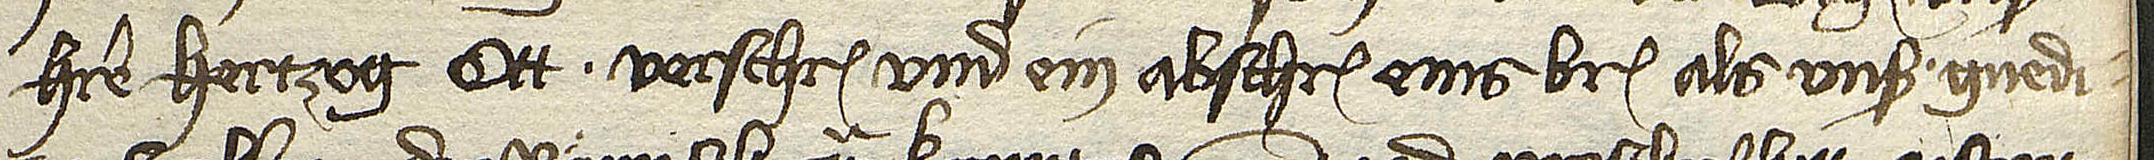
h*re hercʒog Ott . verſchr* vnd ein abſchr* eins br* als vnſ* gnedi =
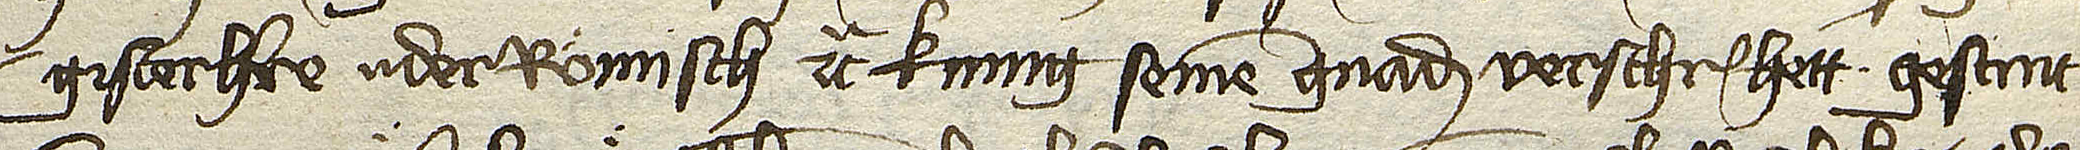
giſter h*re ~ der Römiſch ec* kunig ſeine* gnad* verſchr* hett . geſant
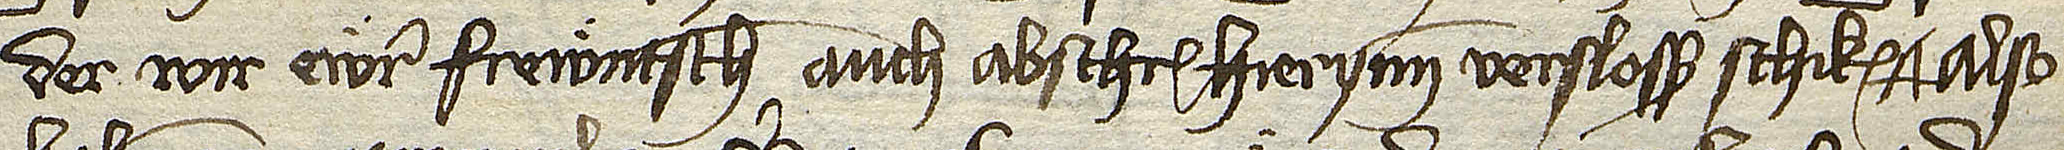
Der wir eẅr* freẅntſch* auch abſchr* hierynn* verſloſſ* ſchik* Alſo
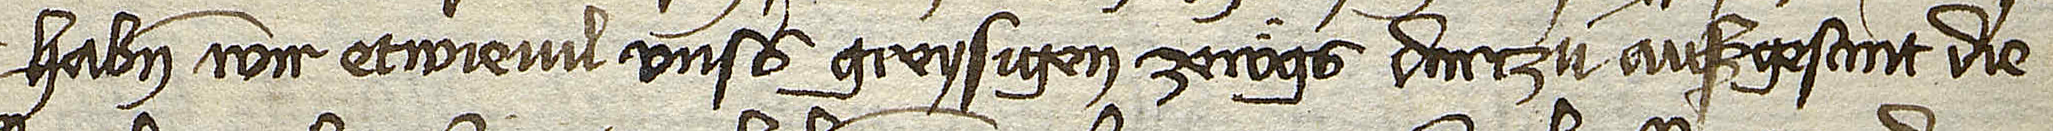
habn* wir etwieuil vnſ*s greyſigen ʒeẅgs Darcʒu auſʒgeſant die
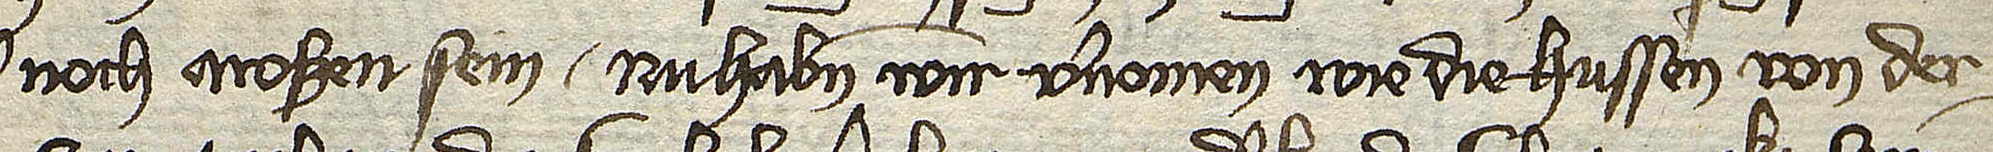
noch awſʒen ſein / Nu habn* wir v*nomen wie die huſſen von der
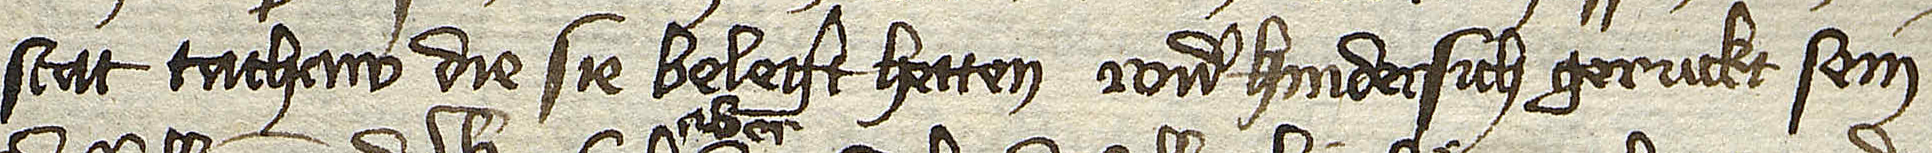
ſtat tachaw die ſie beleg*t hetten wid* hinderſich geruckt ſein
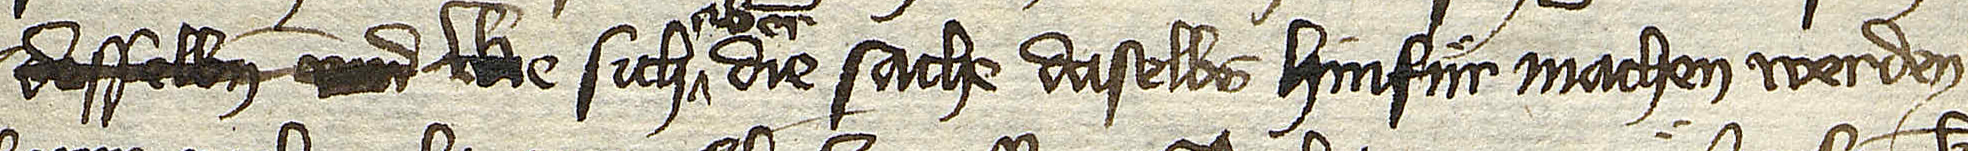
Deſſelbn* vnd Wie ſich die ſache daſelbs hinfür machen werden
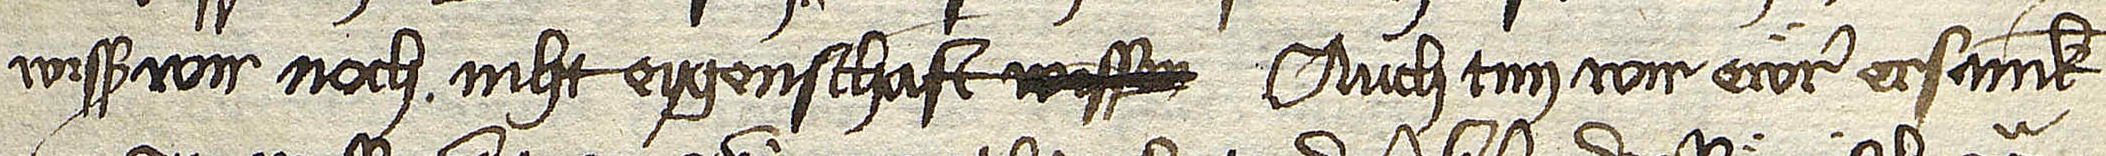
wiſſ* wir noch niht eygenſchaft wiſſen Auch tun wir eẅr* erſamk*
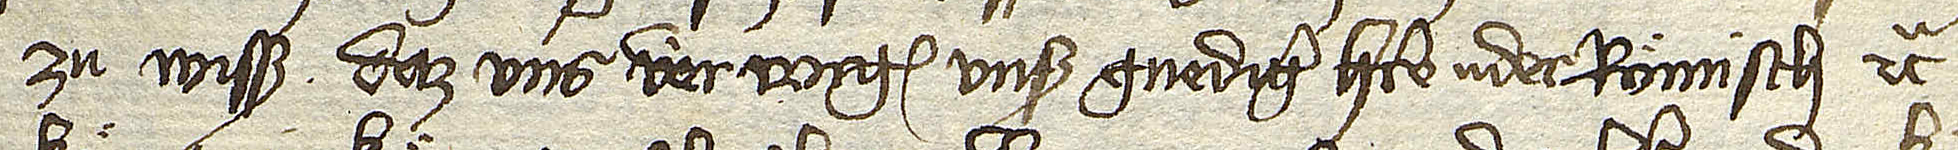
ʒu wiſſ* . daʒ vns der vorg* vnſ* gnedig* h*re ~ der Römiſch ec*
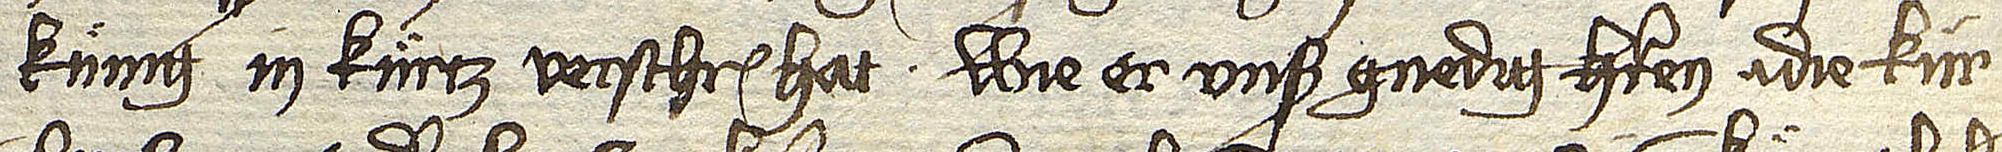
künig in kürcʒ verſchr* hat . Wie er vnſ* gnedig* h*ren ~ die kür -
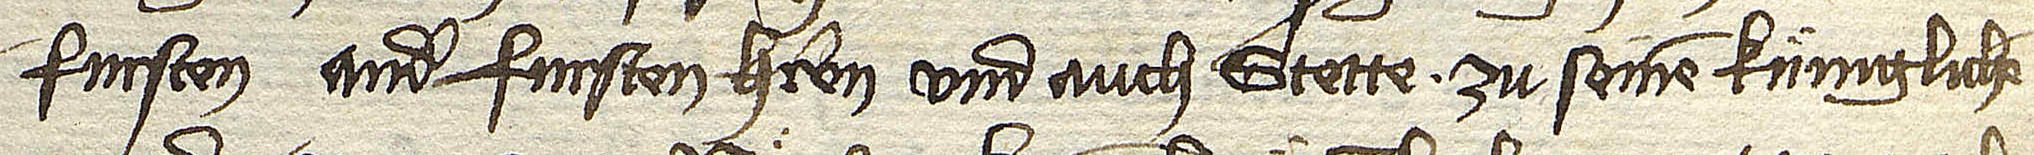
furſten and* furſten h*ren vnd auch Stette . ʒu ſeine* künigliche*
